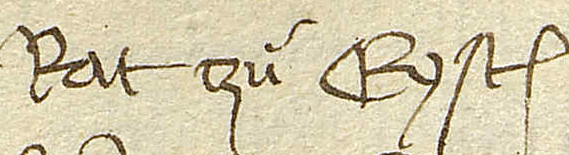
Rat cʒü Eyſt*
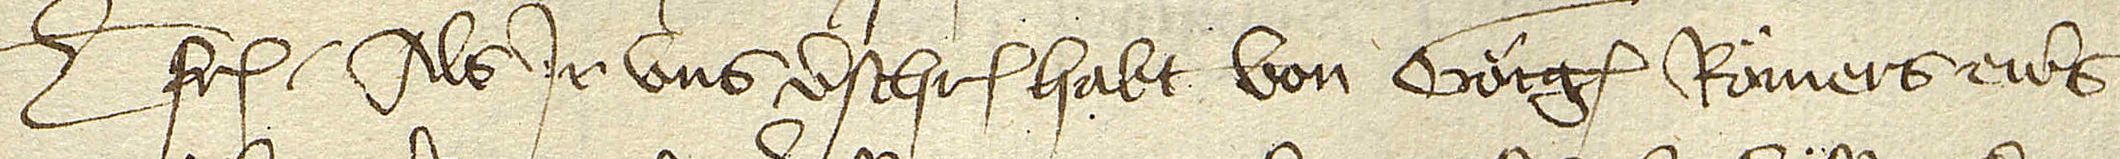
L* fr* / Als Ir vns v*ſchr* habt von Görg* Römers ew*s
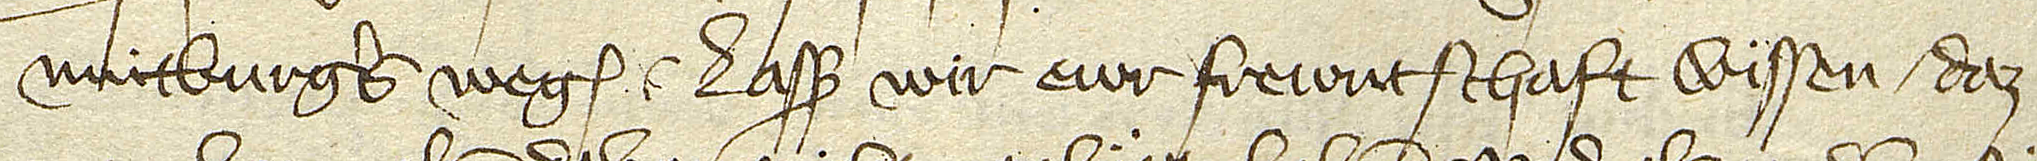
mitburg*s weg* / Laſſ* wir ewr frewntſchaft wiſſen / daʒ
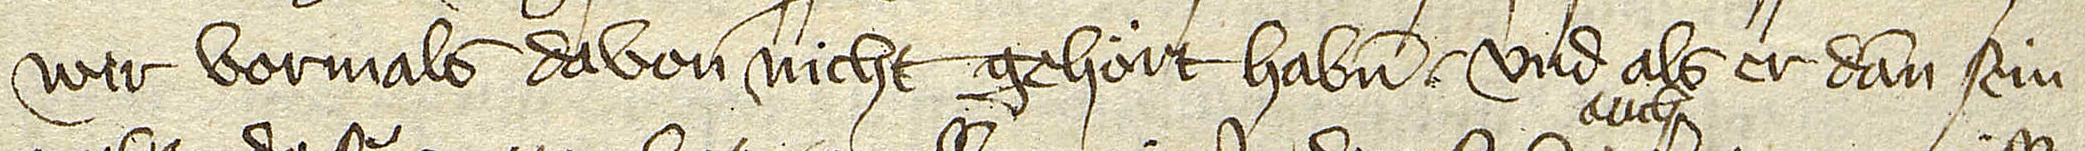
wir vormals davon nicht gehört habn* / vnd als er dan* ſein
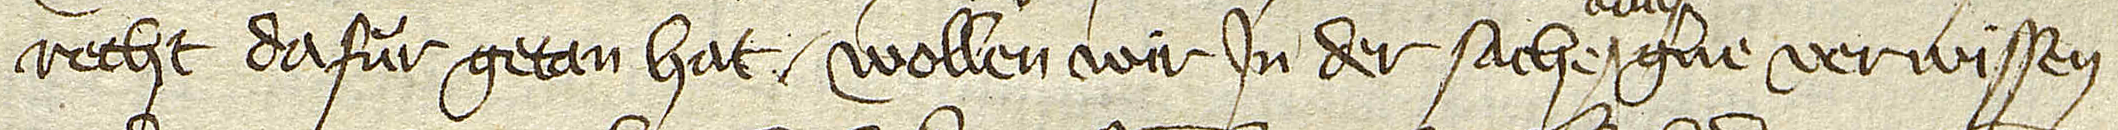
recht dafür getan hat / wollen wir In der ſache g*ne verwiſſen
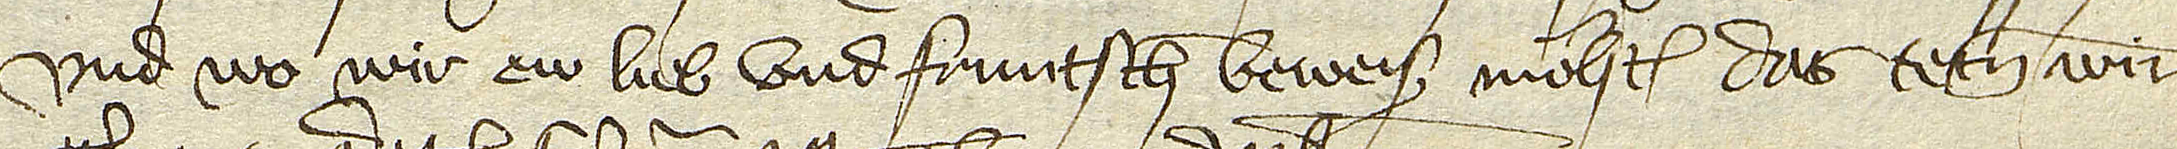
vnd wo wir ew lieb vnd fruntſch* beweiſ* möht* das tetn* wir
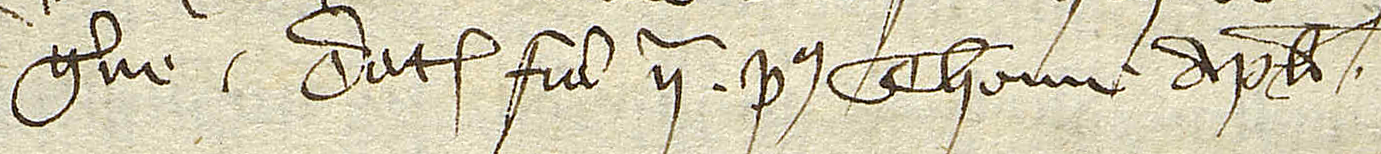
g*ne / Dat* fia* ii* . p* Thome Apli* .
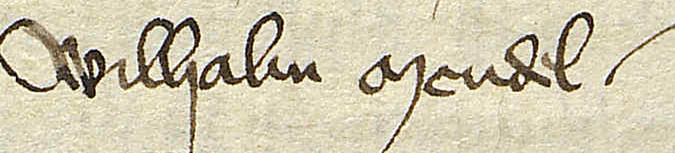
Wilhalm Mendel /
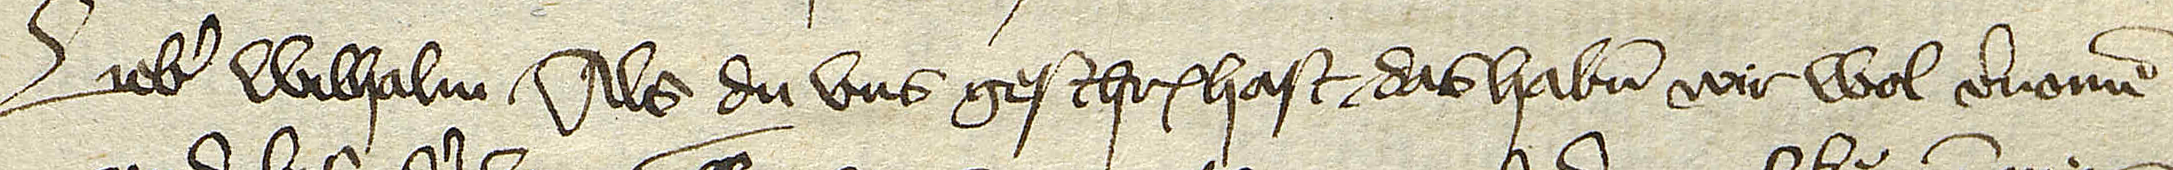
Lieb* Wilhalm / Als du vns geſchr* haſt / das habn* wir wol v*nome*
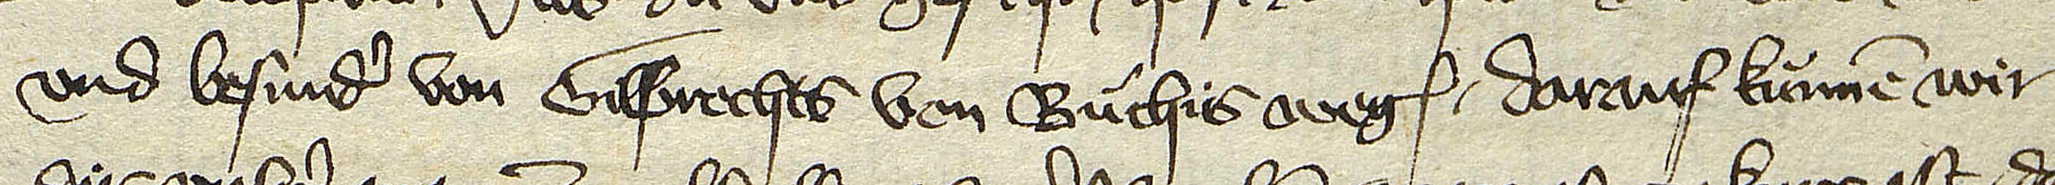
vnd beſund* von Gillbrechts von Büchis weg* / darauf künne* wir
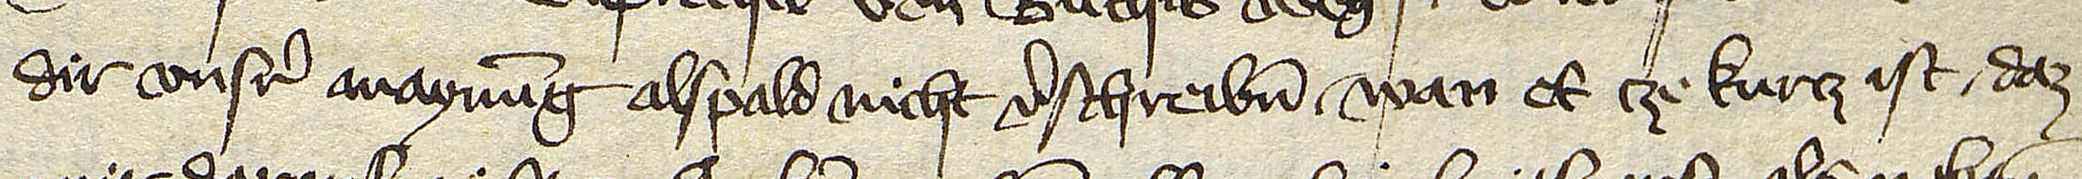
dir vnſr* maynug* alſpald nicht v*ſchreibn* / wan es cʒe kurcʒ iſt / daʒ
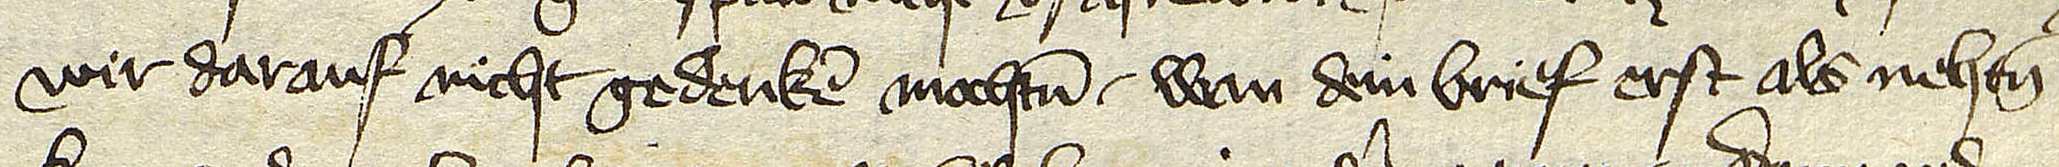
wir darauf nicht gedenke* mochtn* / wan dein brief erſt als nehtn*
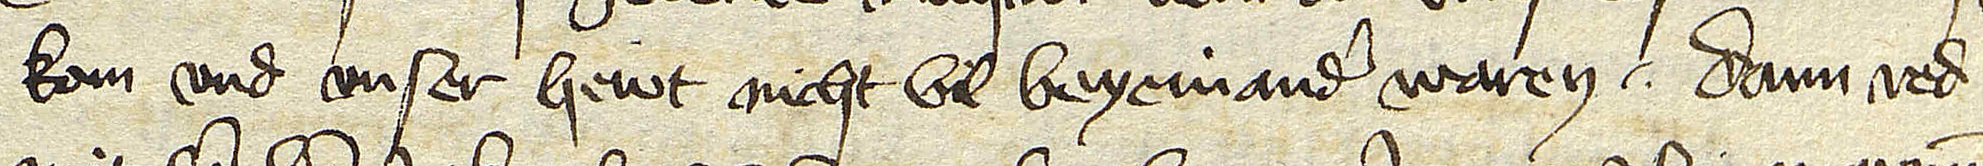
kom vnd vnſer hewt nicht vil beyeinand* waren / . Dann red
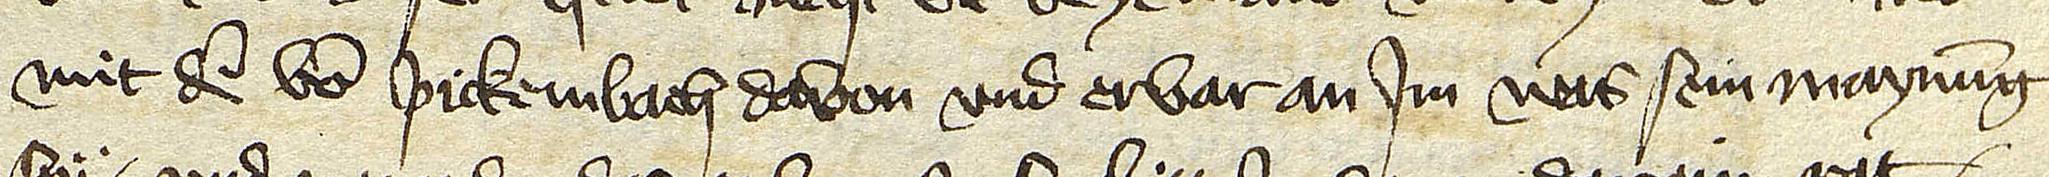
mit d* vo* pickembach davon vnd ervar an Im was ſein maynug*
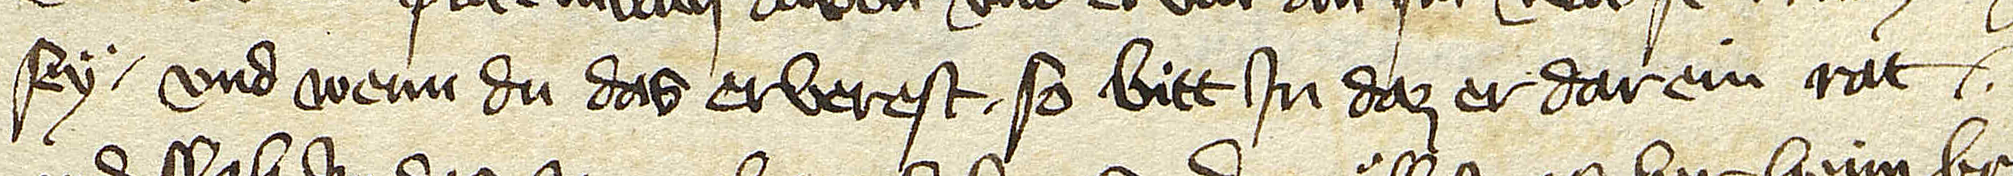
ſey / vnd wenn du das ervereſt / ſo bitt In daʒ er darein rat / .
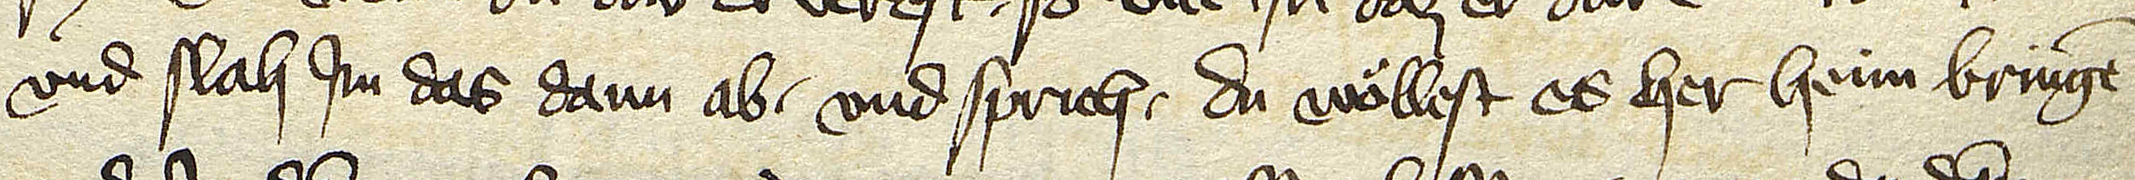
vnd ſlah Im das dann ab / vnd ſprich / du wölleſt es her heim bringe*
